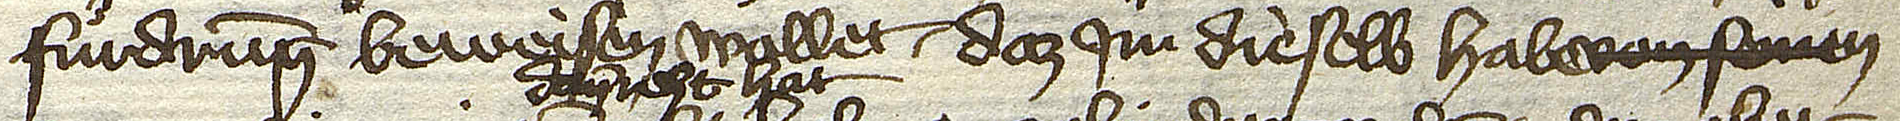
fürdru*g beweiſen wöllet / daʒ Im dieſelb habe von ſeinen
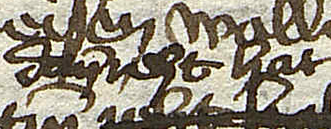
dan* reht hat
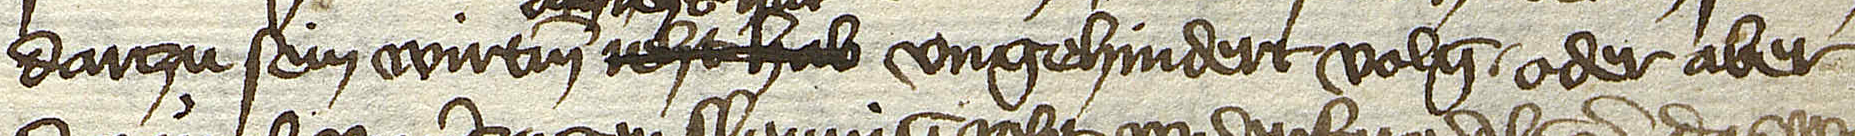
darcʒu ſein wirtin reht hab vngehindert volg* . oder aber
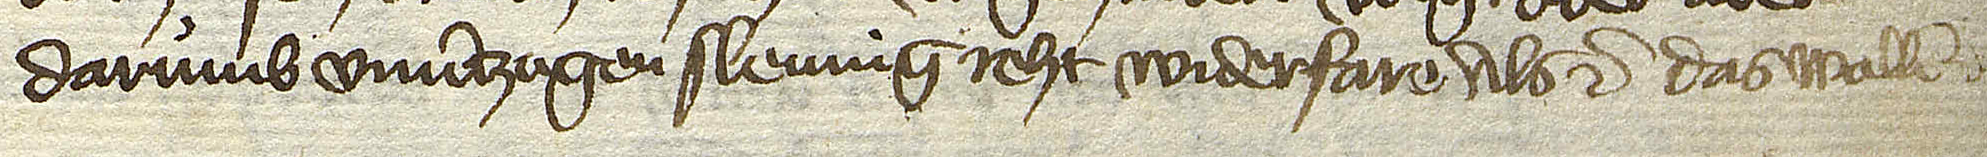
darümb vnu*cʒogen ſleunig reht widerfare Als ec* das wolle*
